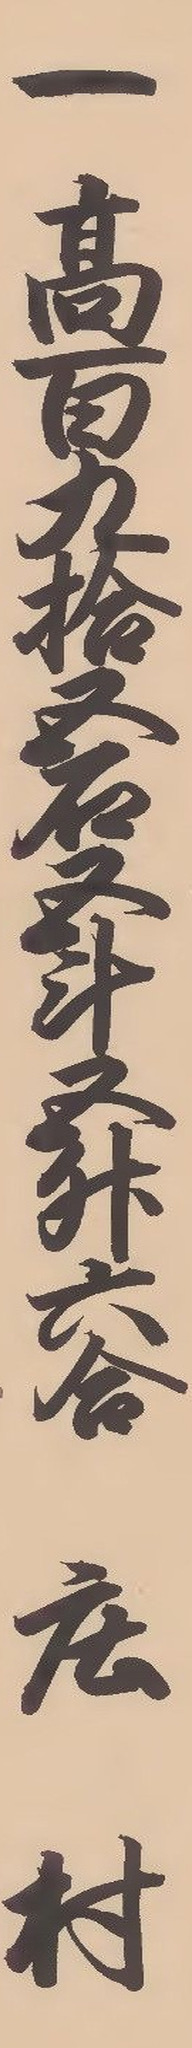一高百九拾五石五斗五升六合庄村
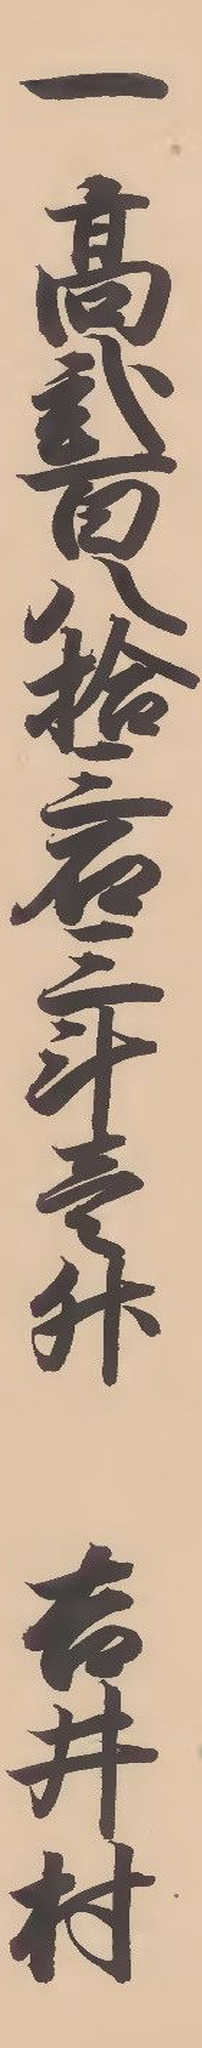一高弐百八拾三石三斗壱升吉井村
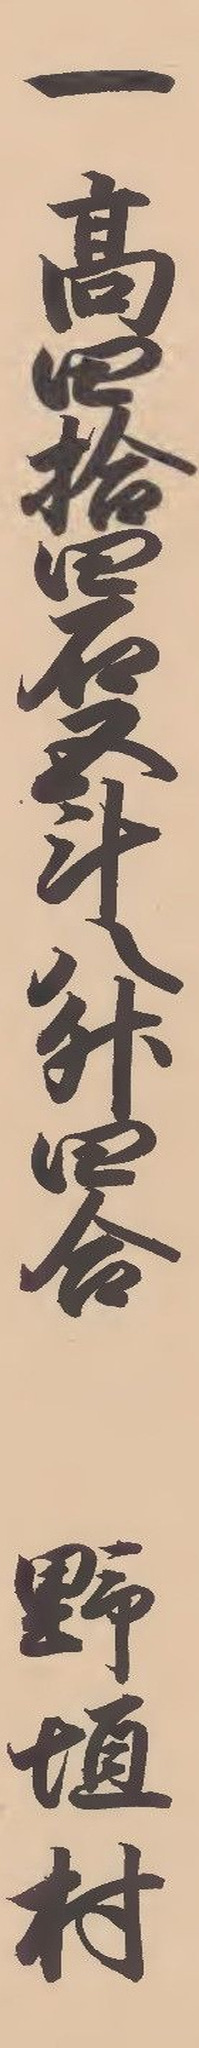一高四拾四石五斗八升四合野垣村
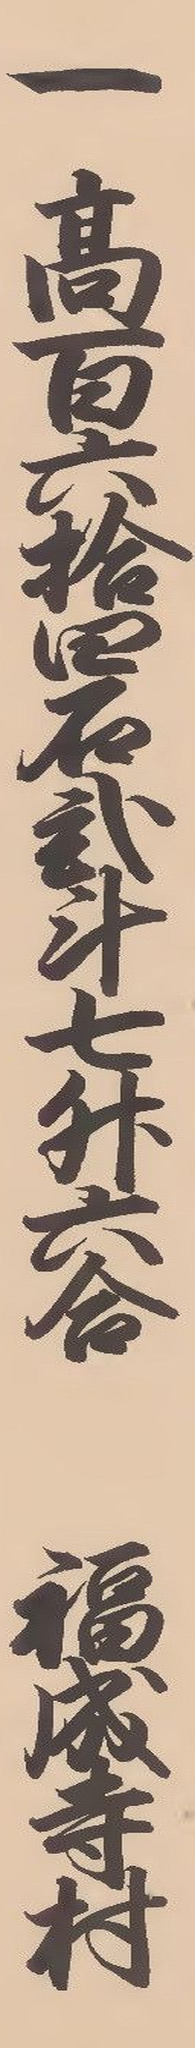一高百六拾四石弐斗七升六合福成寺村
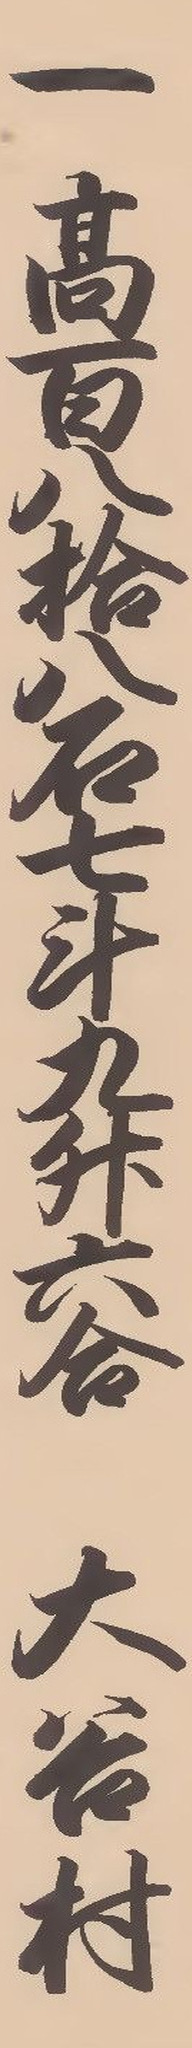一高百八拾八石七斗九升六合大谷村
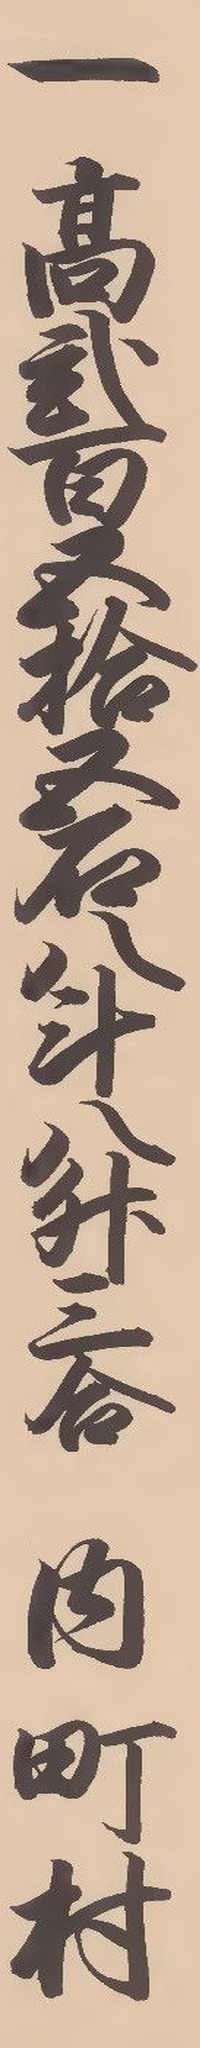一高弐百五拾五石八斗八升三合内町村
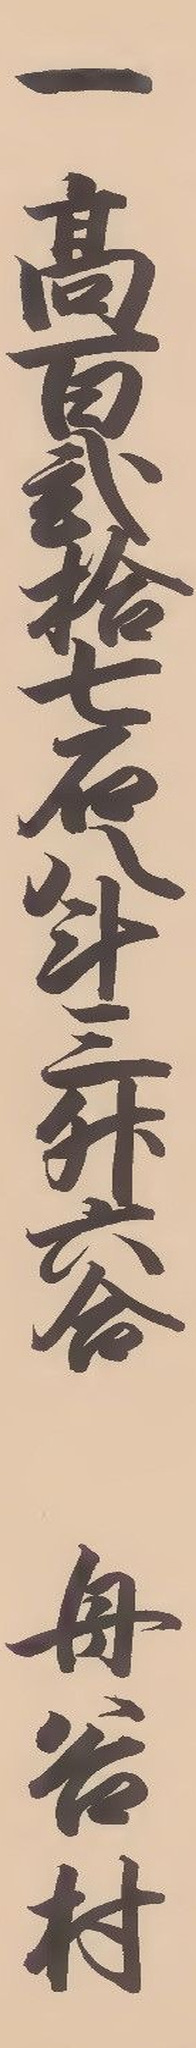一高百弐拾七石八斗三升六合舟谷村

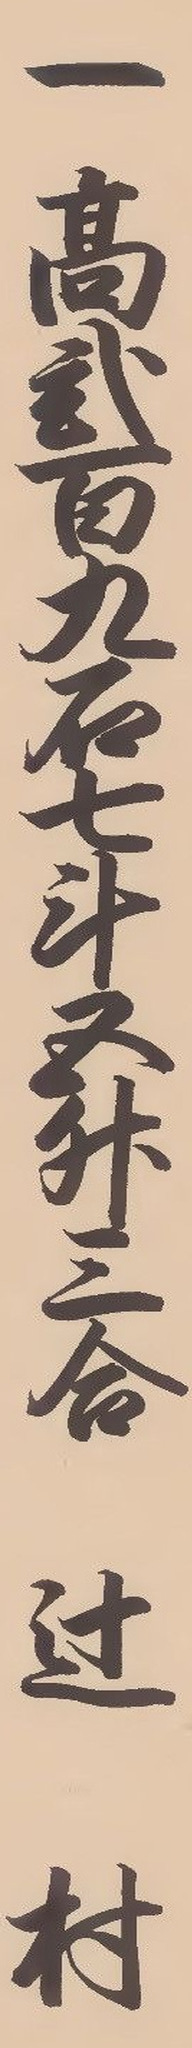一高弐百九石七斗五升三合辻村
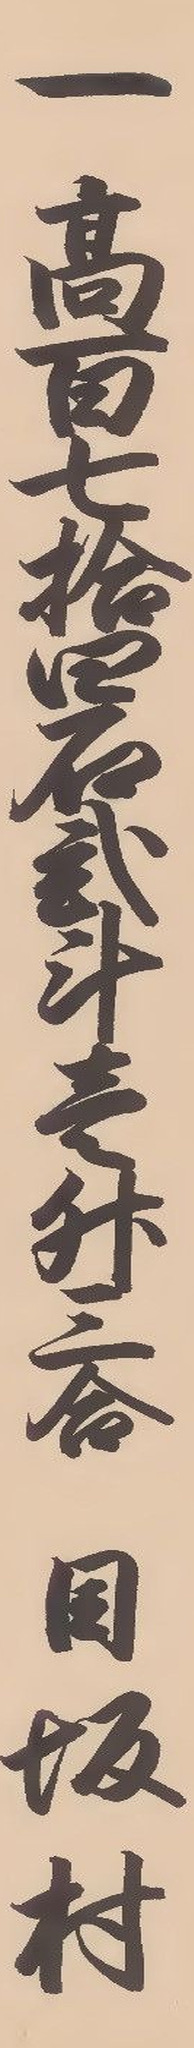一高百七拾四石弐斗壱升三合目坂村
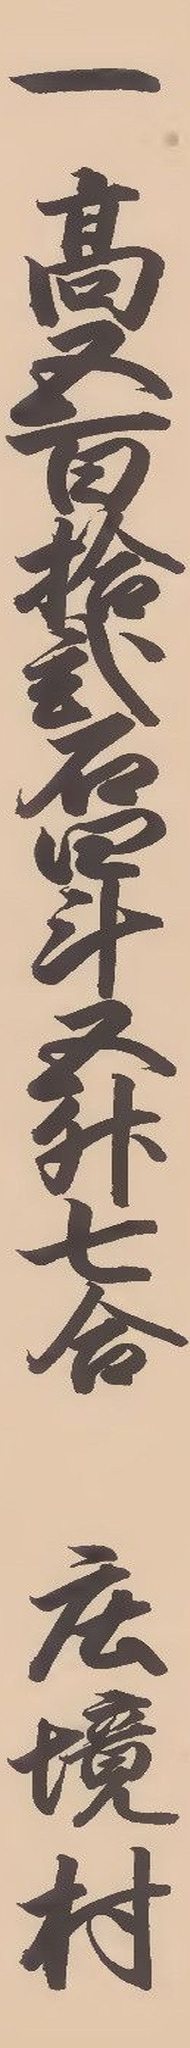一高五百拾弐石四斗五升七合庄境村
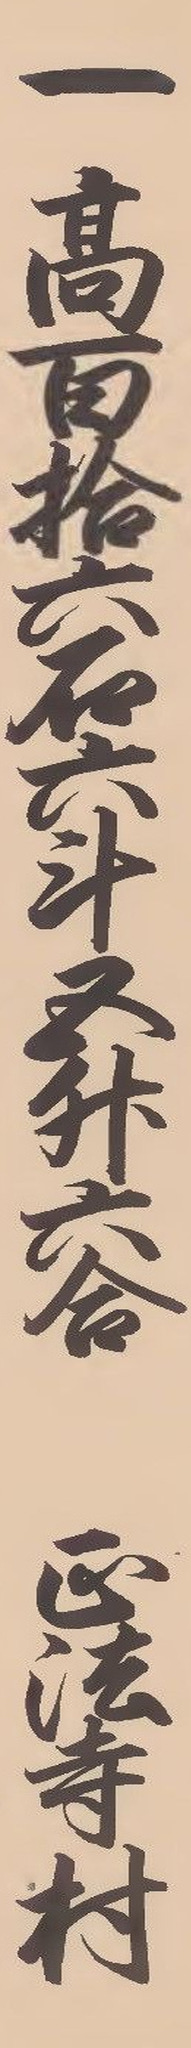一高百拾六石六斗五升六合正法寺村
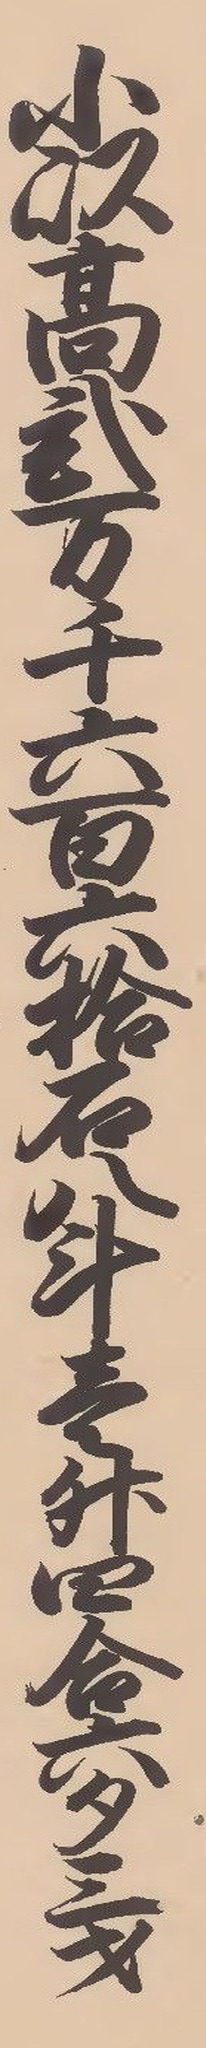小以高弐万千六百六拾石八斗壱升四合六勺三才

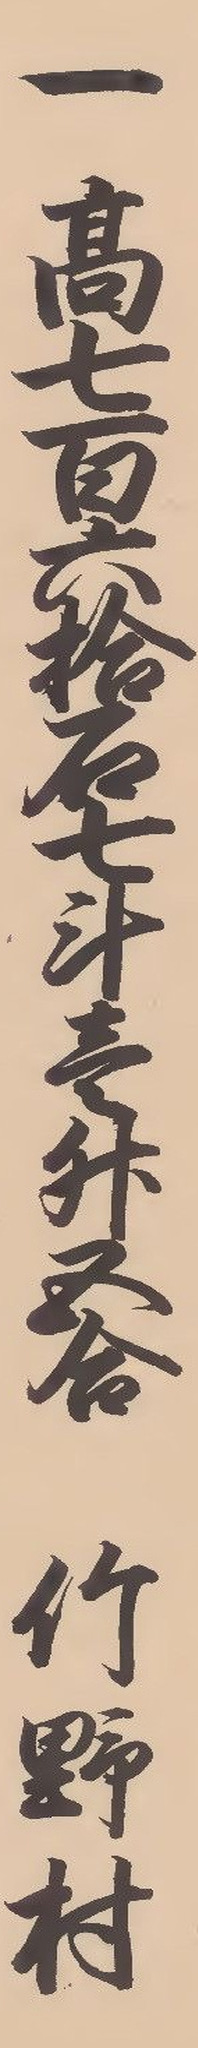一高七百六拾石七斗壱升五合竹野村
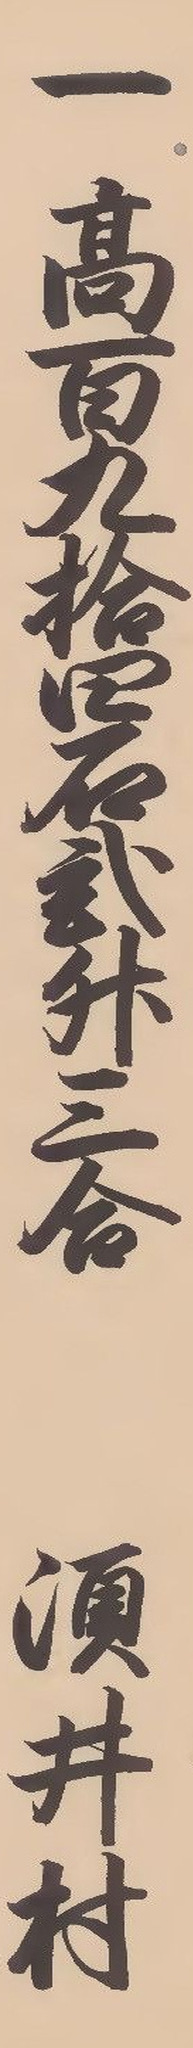一高百九拾四石弐升三合須井村
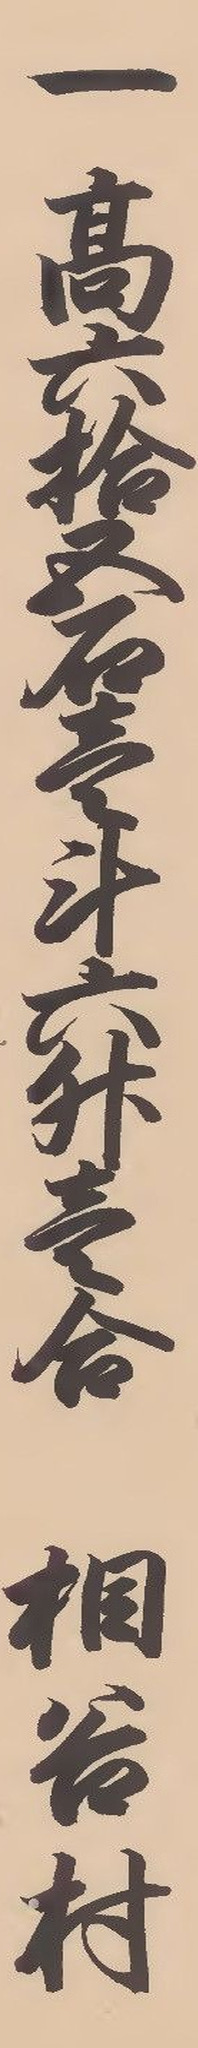一高六拾五石壱斗六升壱合相谷村
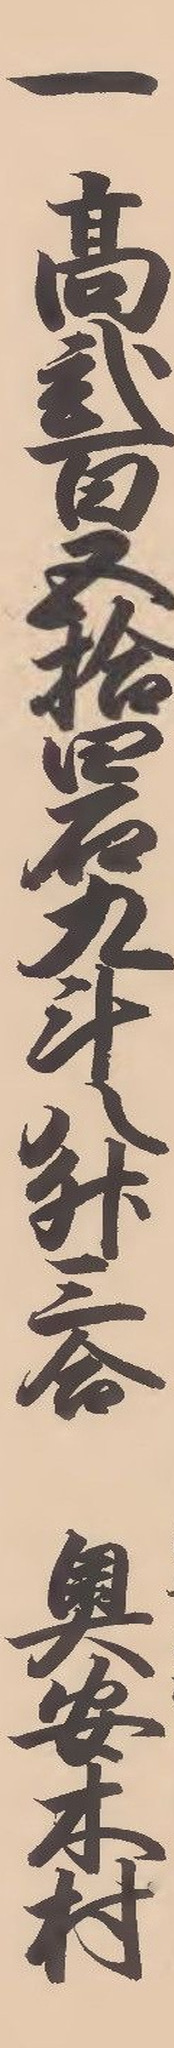一高弐百五拾四石九斗八升三合奥安木村
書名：但馬国郷帳
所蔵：国立公文書館 National Archives of Japan
